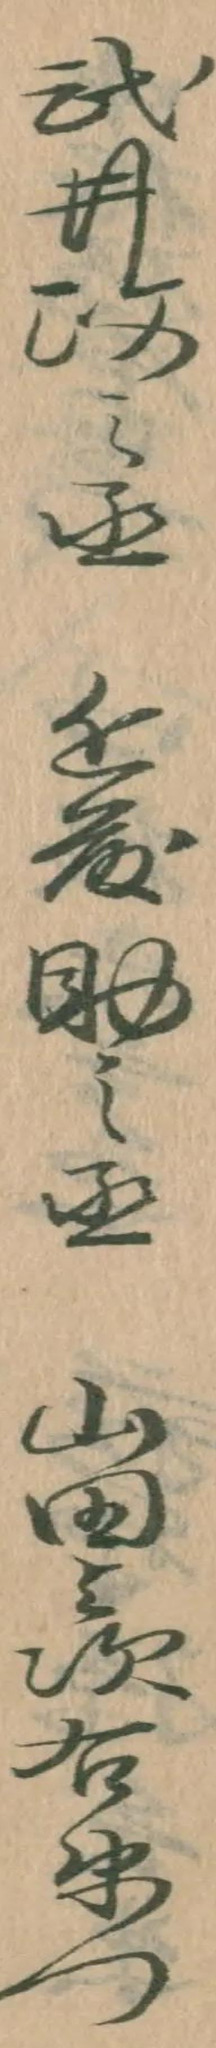武井政之丞近藤助之丞山田与次右衛門
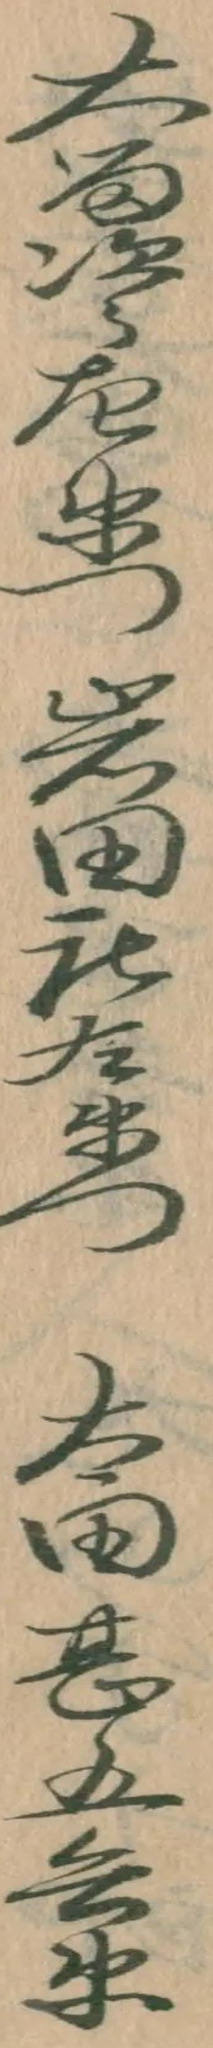大留次郎左衛門岩田庄右衛門太田甚五兵衛
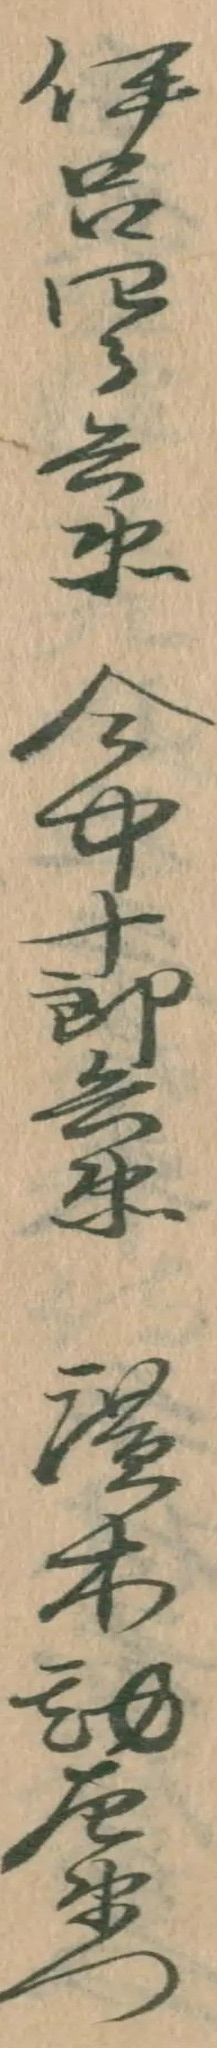伊呂四郎兵衛今中十郎兵衛広木勘左衛門
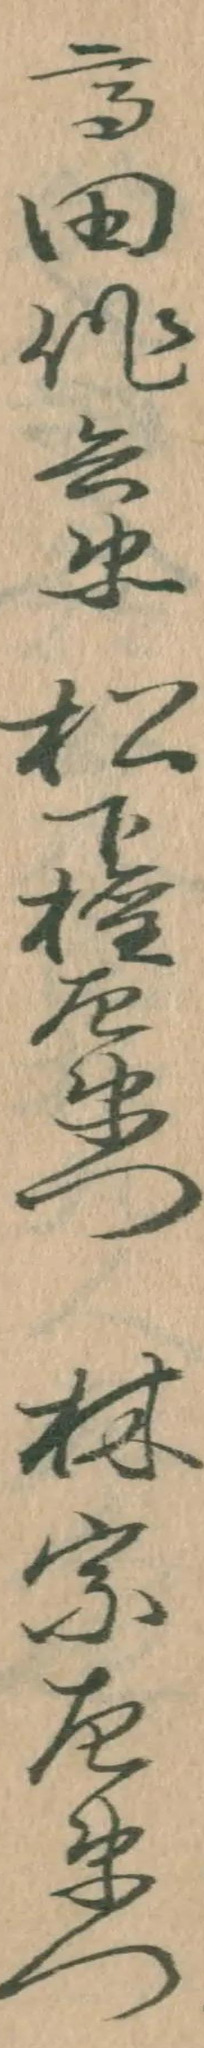高田作兵衛松下権左衛門林宗左衛門
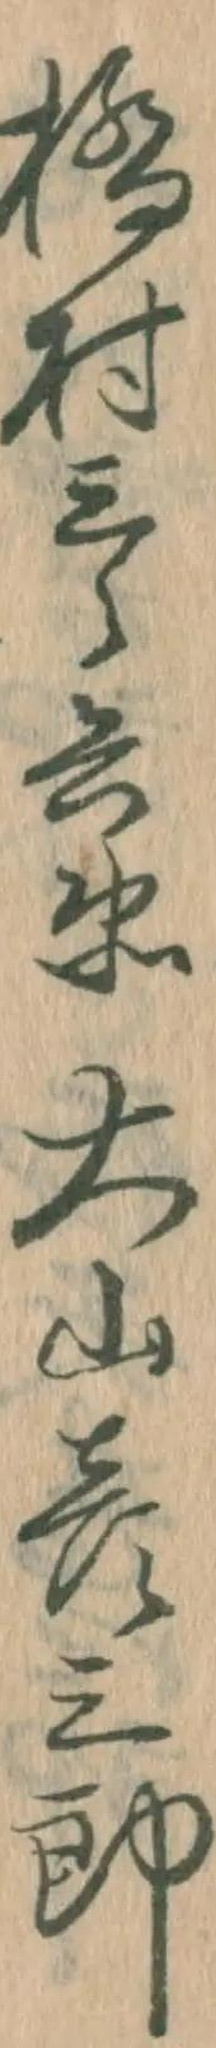橋村三郎兵衛大山彦三郎
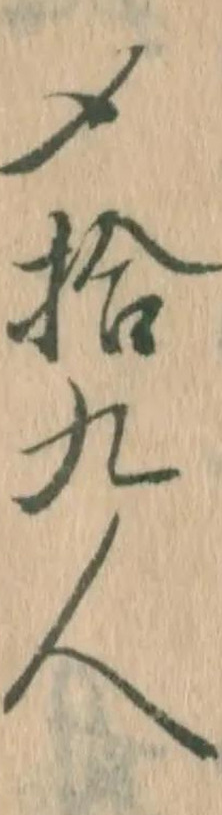〆拾九人
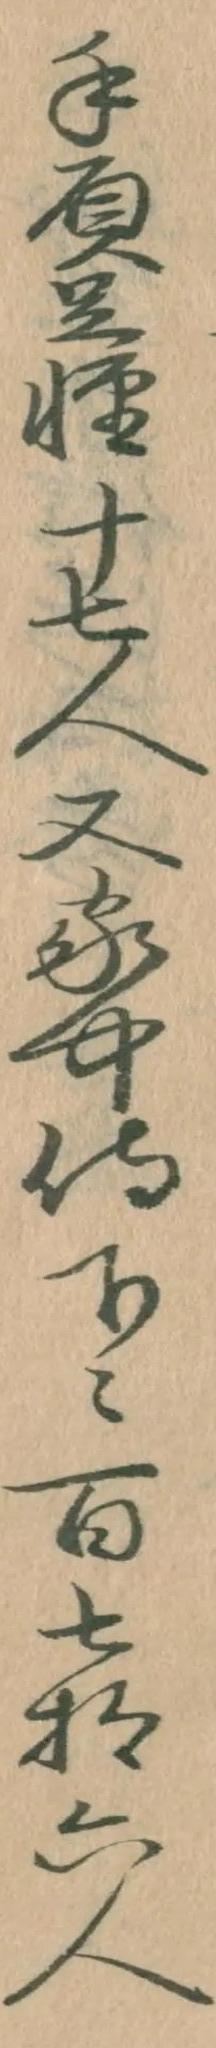手負足軽十七人又家中侍下々百七拾六人
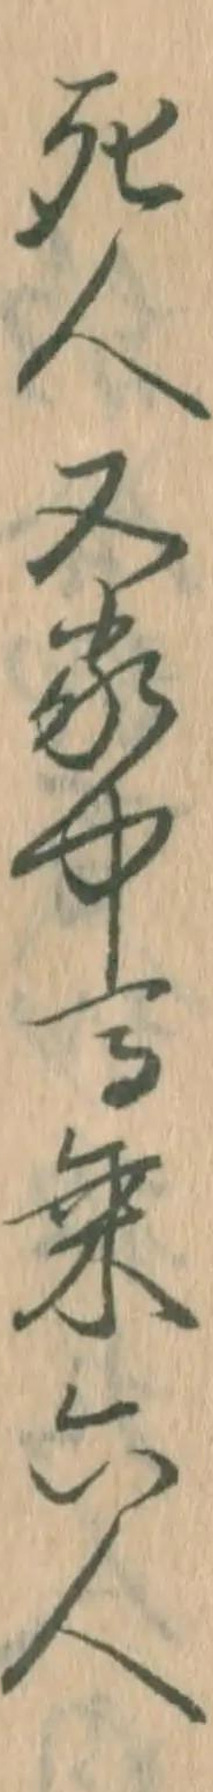死人又家中馬乗六人

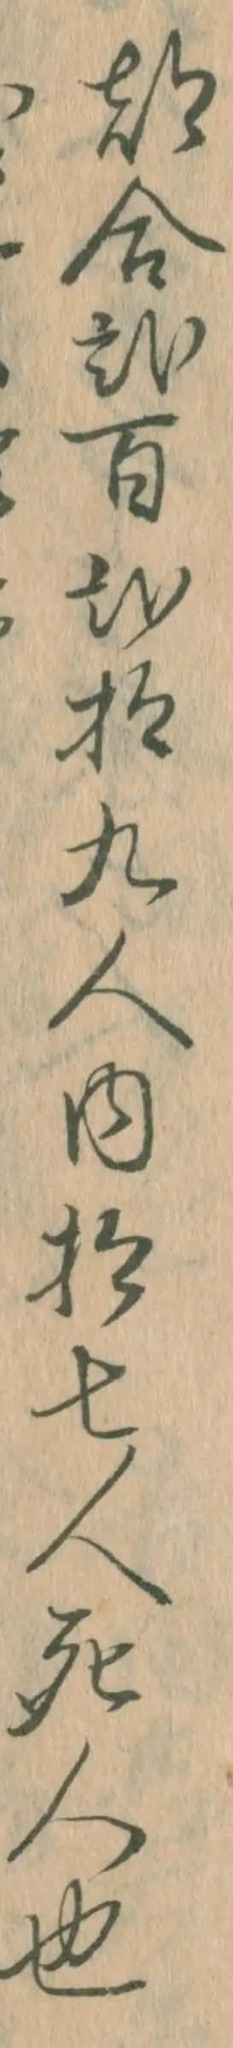都合弐百弐拾九人内拾七人死人也
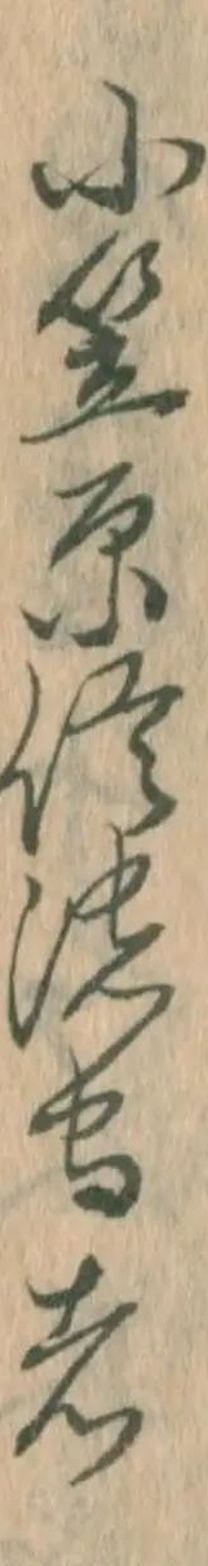小笠原信濃守者
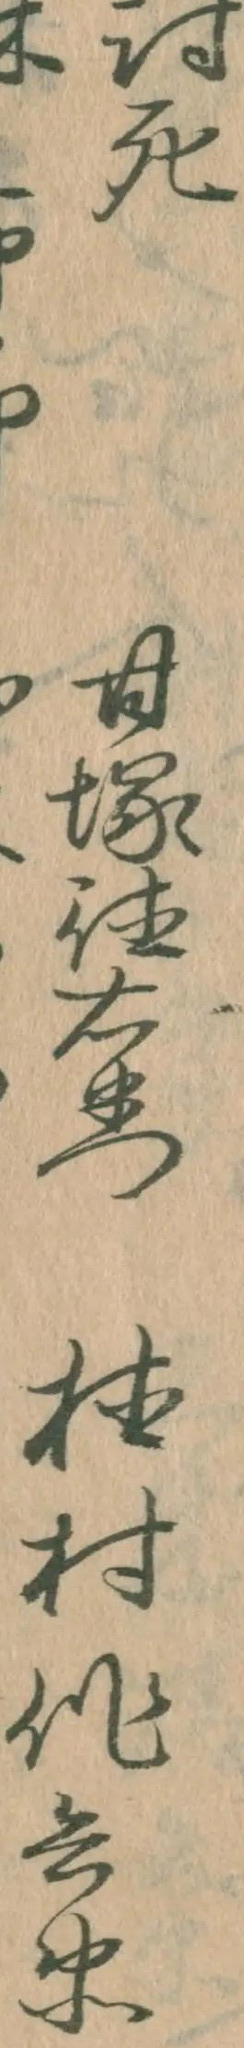討死甘塚徳右衛門植村作兵衛
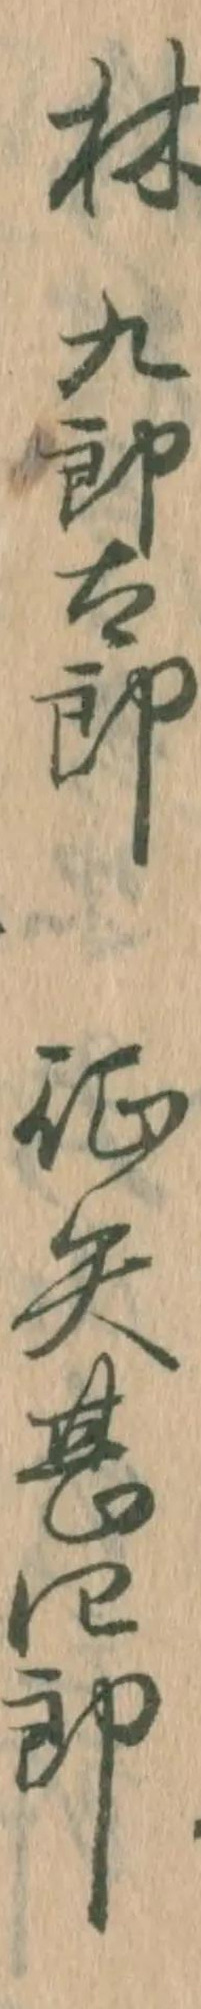林九郎太郎征矢甚四郎
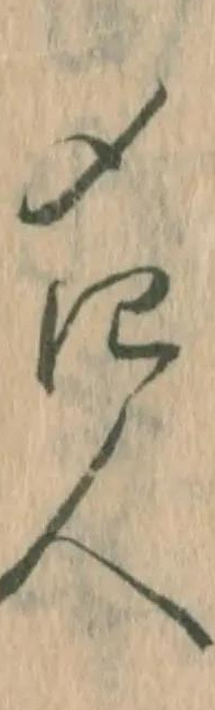〆四人
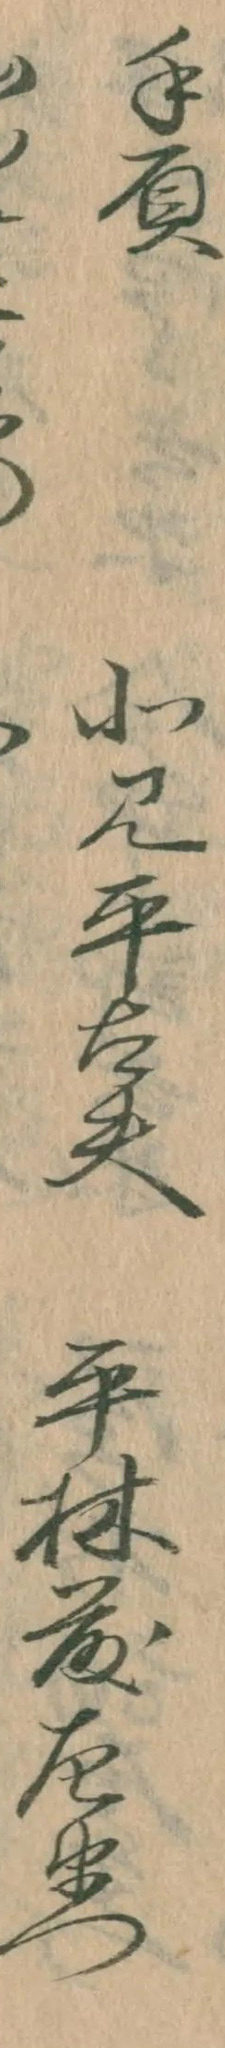手負北見平太夫平林藤左衛門
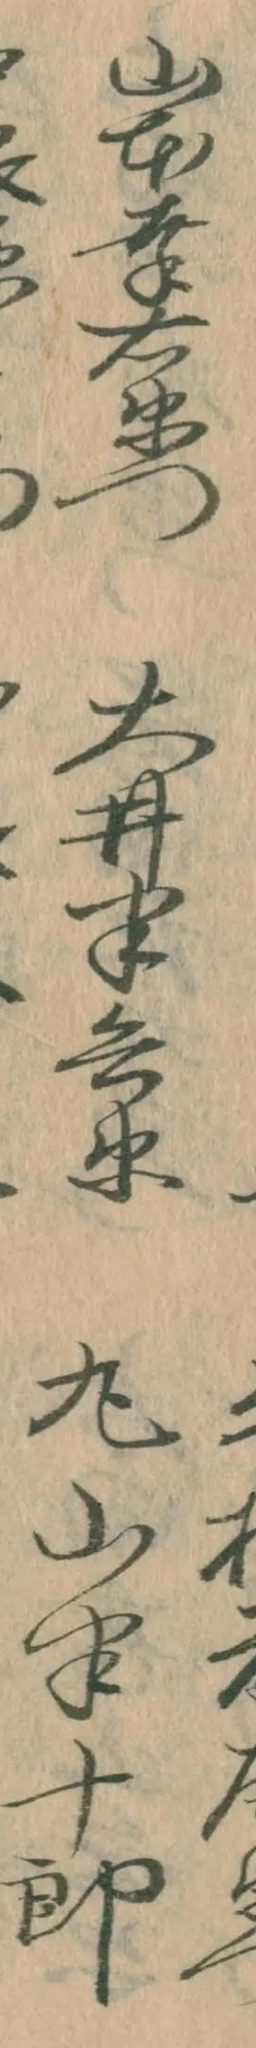山本幸右衛門大井半兵衛丸山半十郎
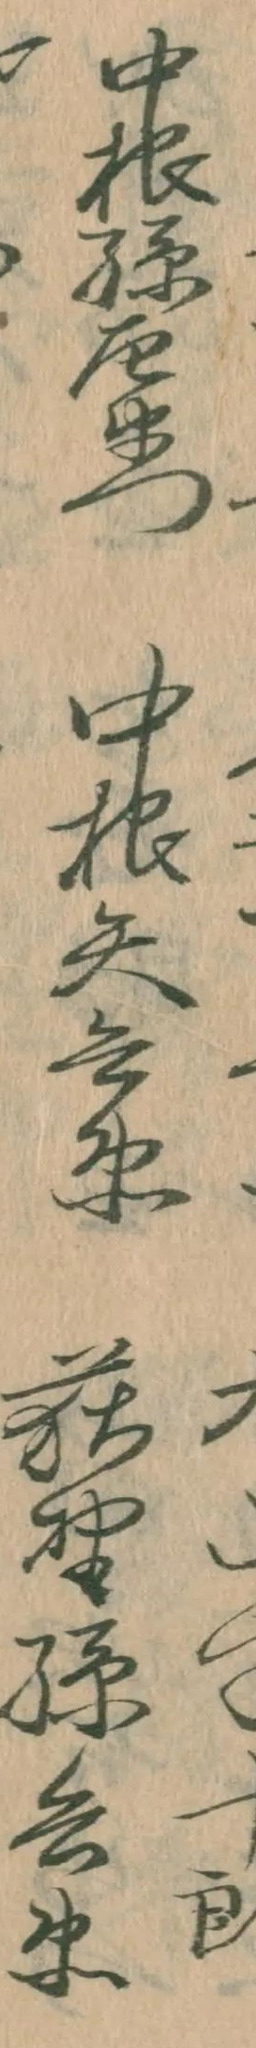中根孫左衛門中根矢兵衛荻野孫兵衛
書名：切支丹御退治記 49巻. [9]
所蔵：国立国会図書館 National Diet Library, JAPAN
